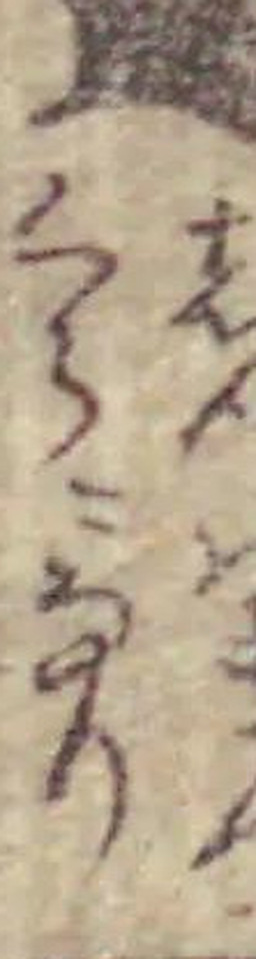くらになり
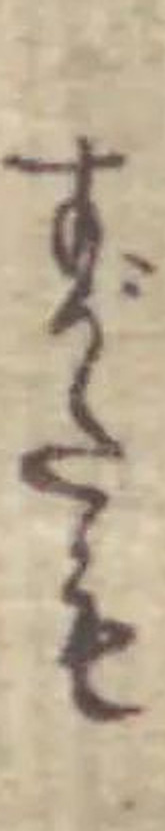すがたも
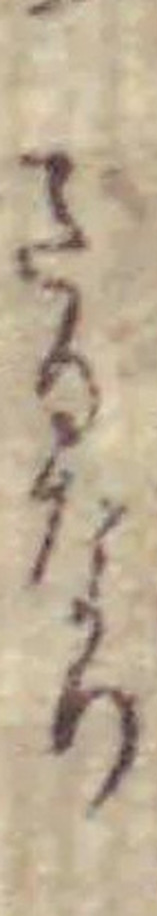たるなり
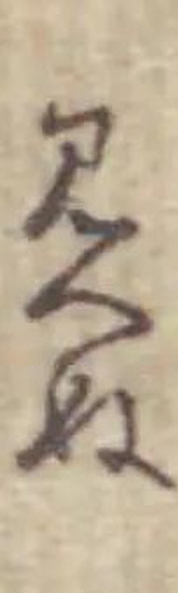見へぬ
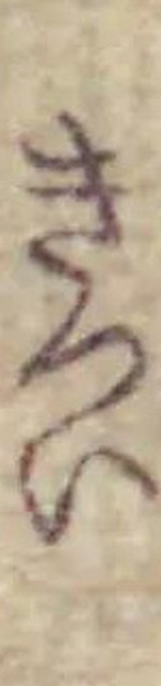きつい
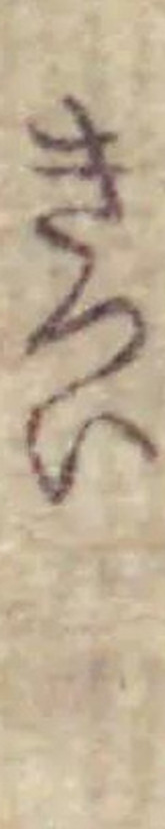きつい
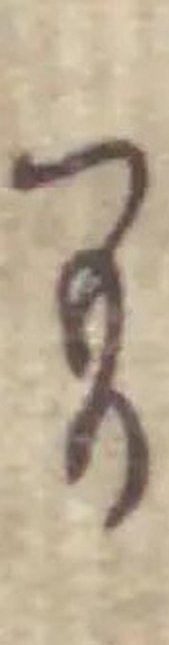つもり
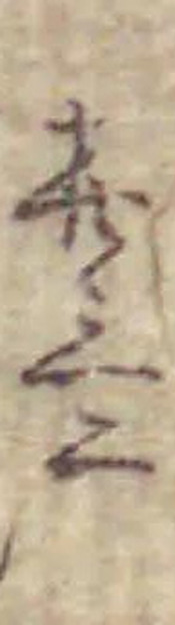喜三二
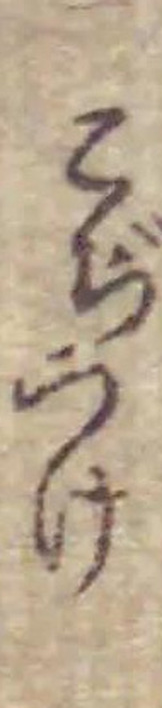こぢつけ

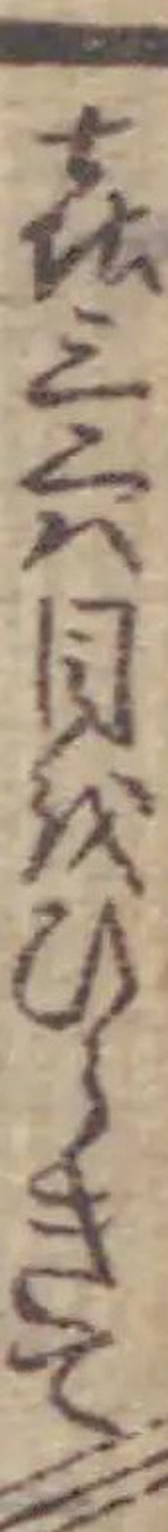喜三二は目をひらきて
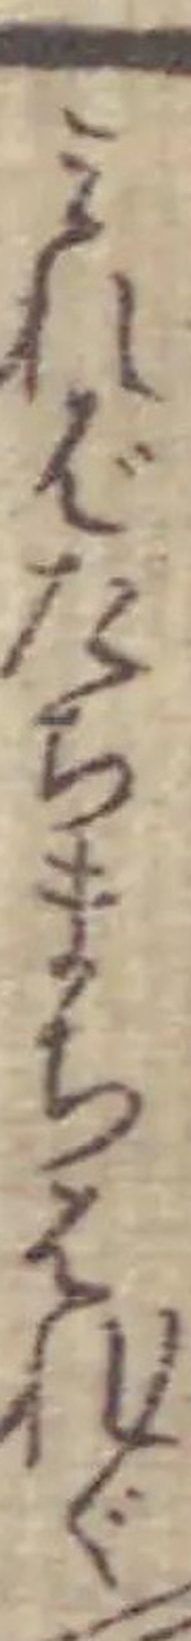みればたちまちはれ〴〵
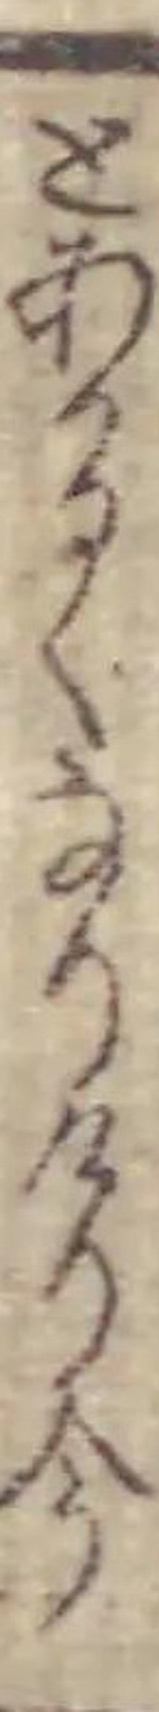とあかるくなりけり今
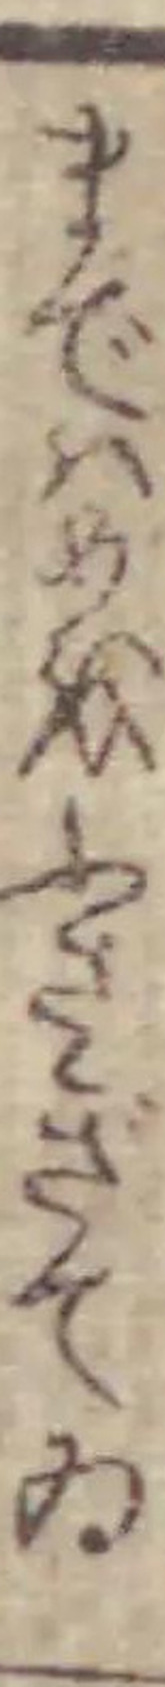まではめをふさぎてゐ
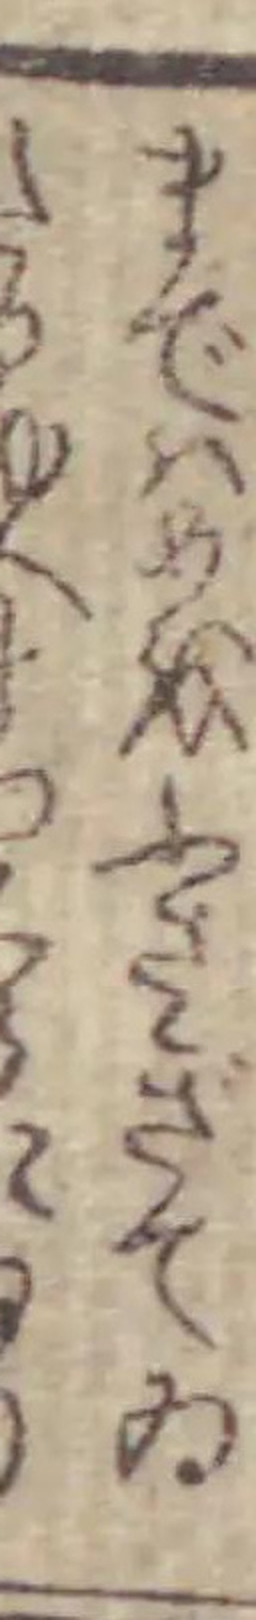たるゆへまつくらになり
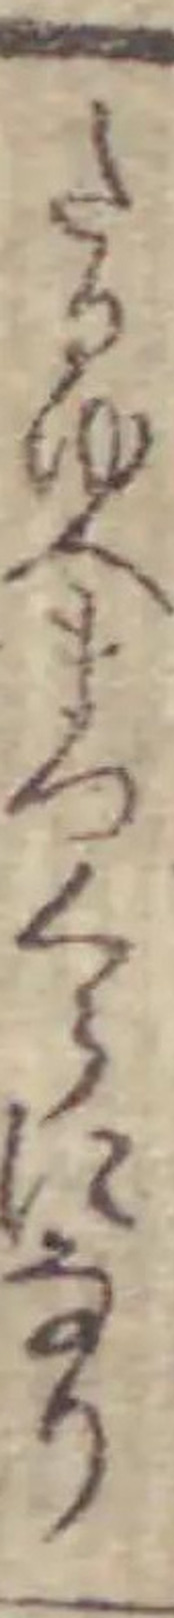たるゆへまつくらになり
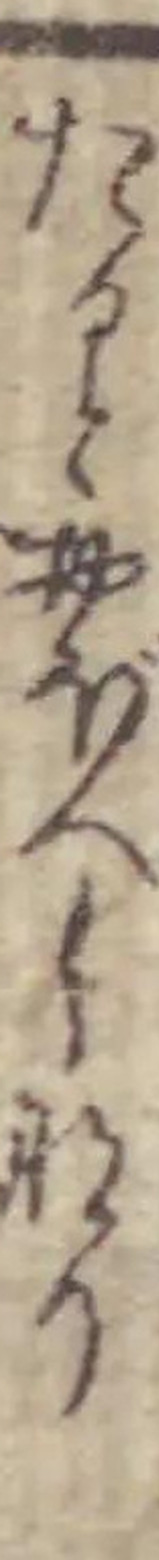たるとおぼへしなり
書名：亀山人家妖 3巻
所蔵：国立国会図書館 National Diet Library, JAPAN
